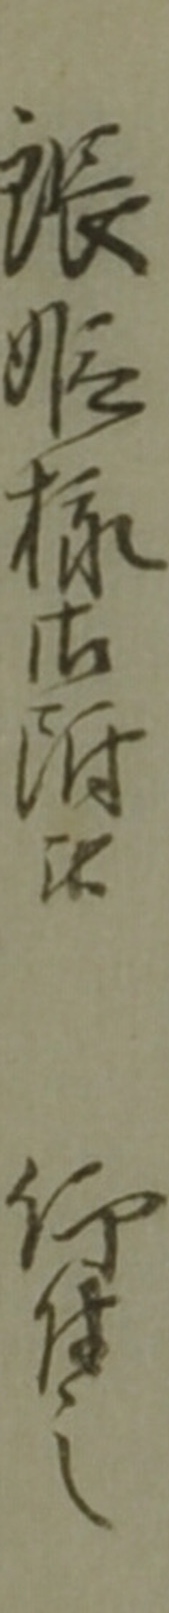鋹姫様御附被仰付之
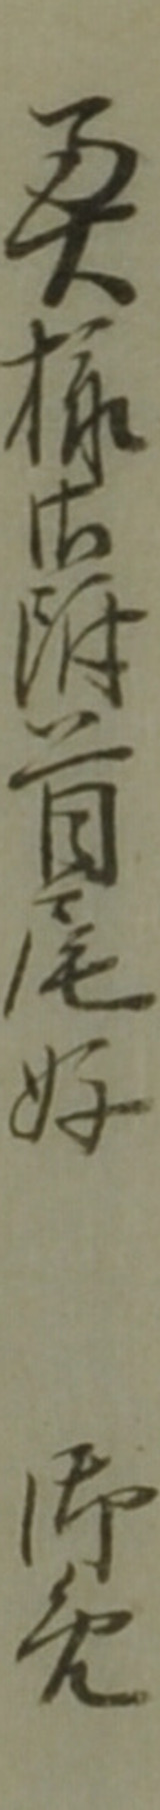奥様御附首尾好御免
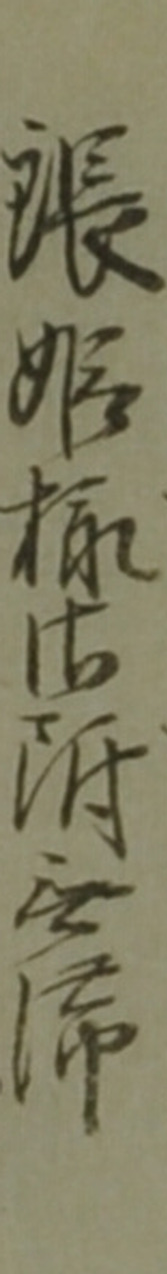鋹姫様御附無滞
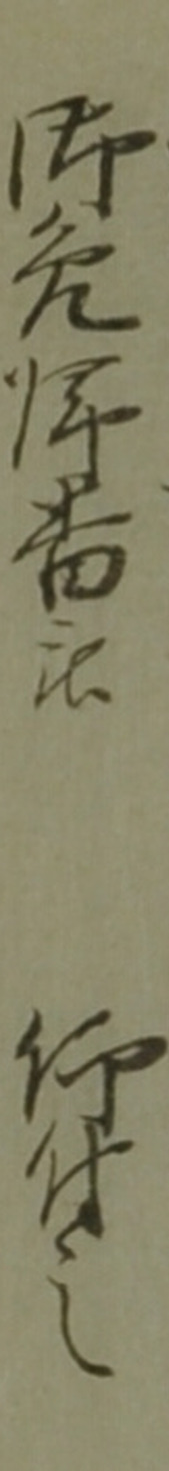御免帰番被仰付之
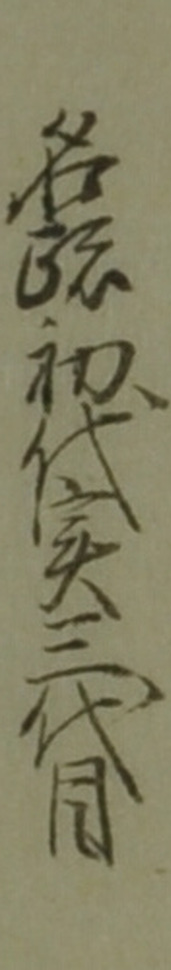名跡初代実三代目
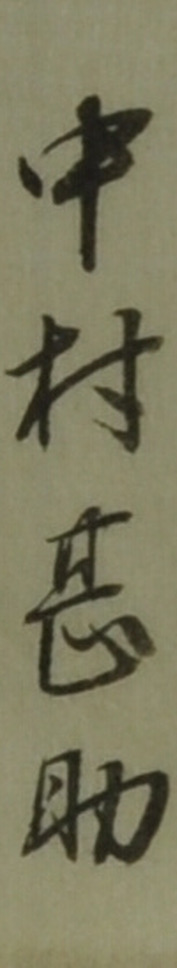中村甚助
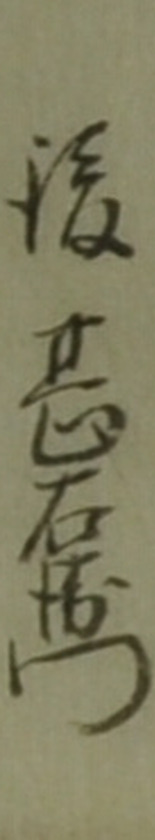後甚右衛門
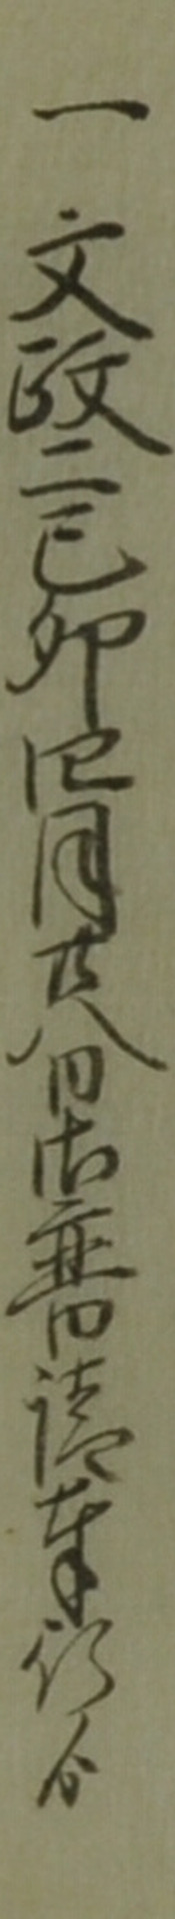一文政二己卯四月廿八日御普請奉行ゟ
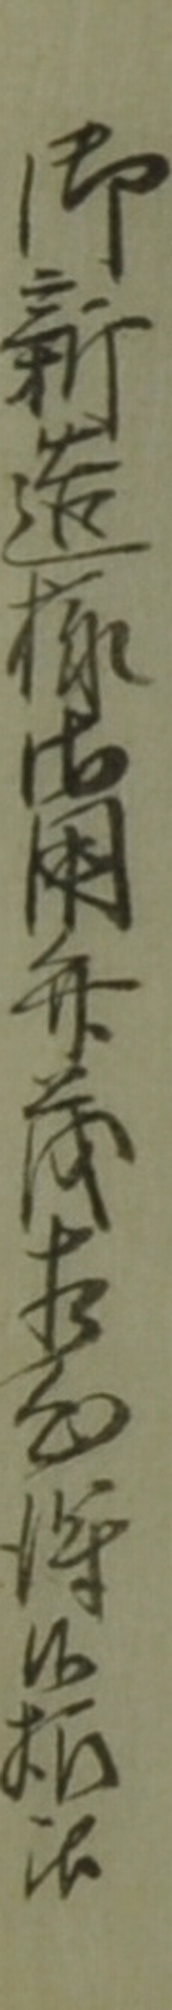御新造様御用弁茂相心得候様被
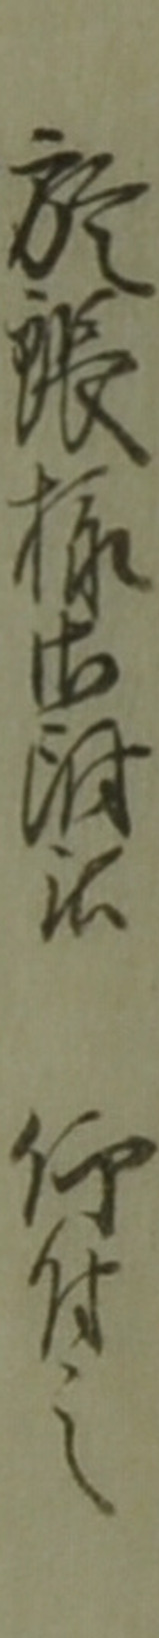於鋹様御附被仰付之
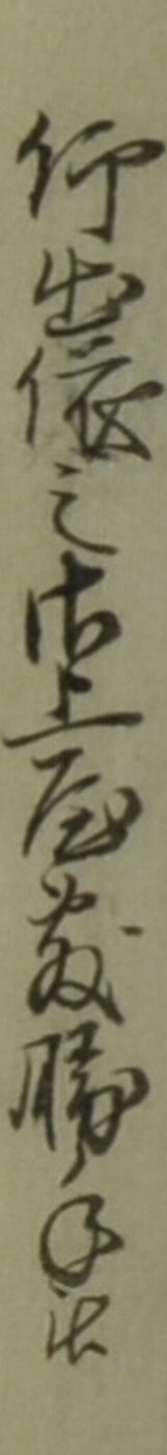仰出依之御上屋敷勝手被

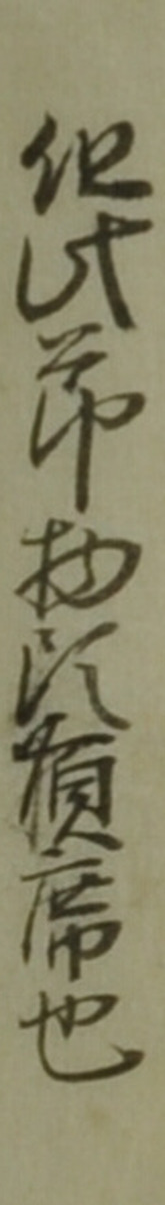但此節物頭順席也
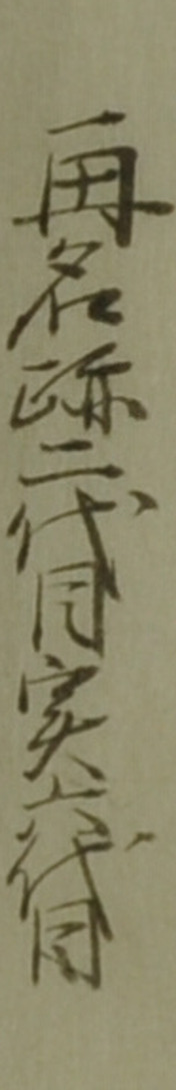再名跡二代目実六代目
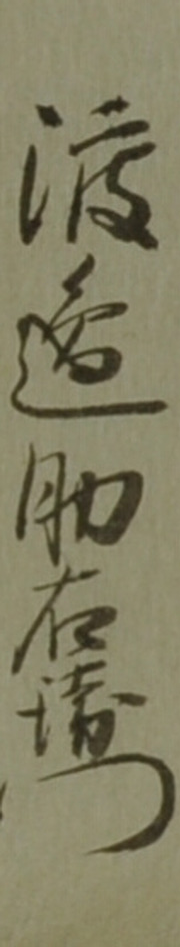渡辺助右衛門
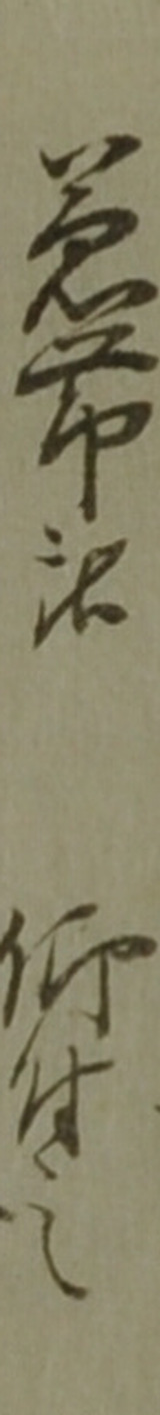兼帯被仰付之
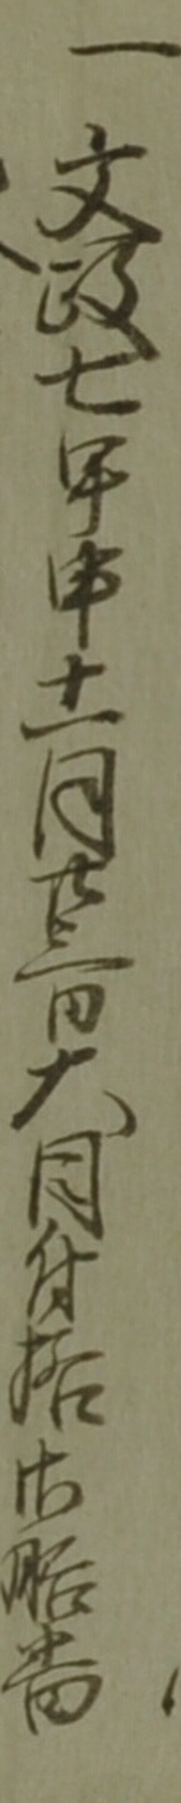一文政七甲申十一月廿三日大目付格御膳番
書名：諸御役代々録（六）
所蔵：伊那市立高遠町図書館・合同会社AMANE
